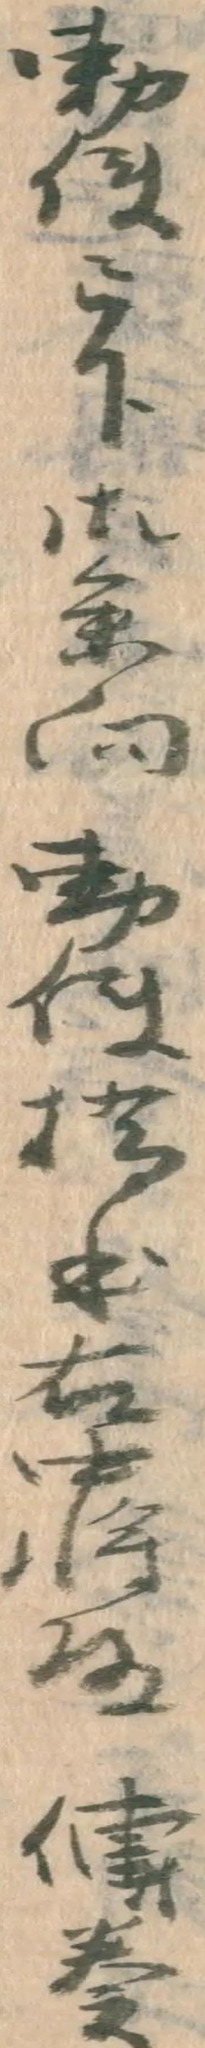勅使被下御参向、勅使橋本右中将殿、傅奏
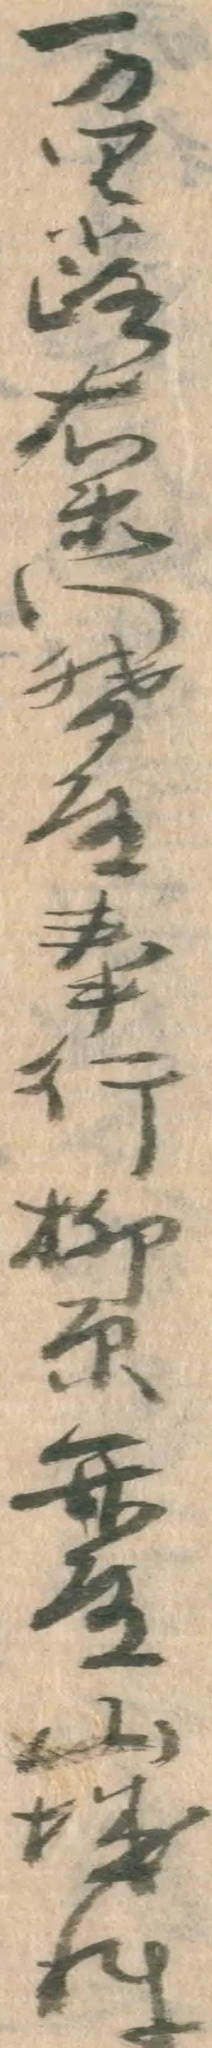万里小路右衛門督殿、奉行柳原弁殿、山城使
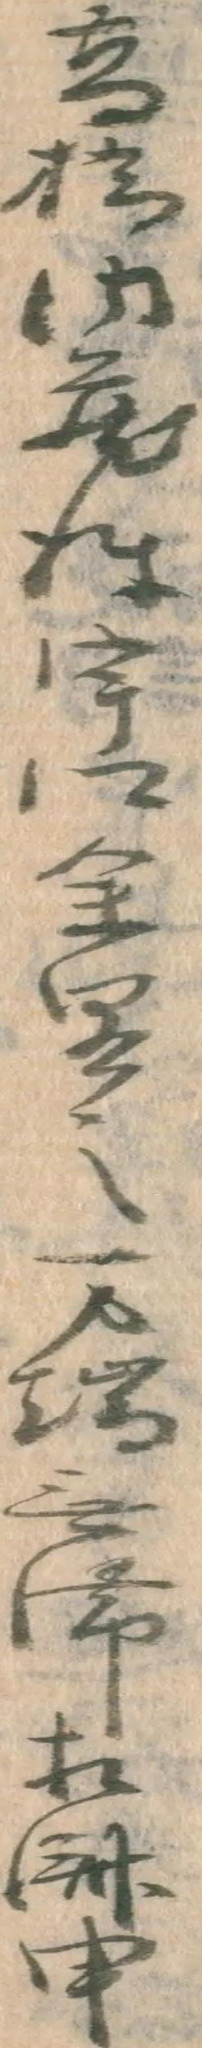高橋内蔵様、宇卿余略之、万端無滞相済、申
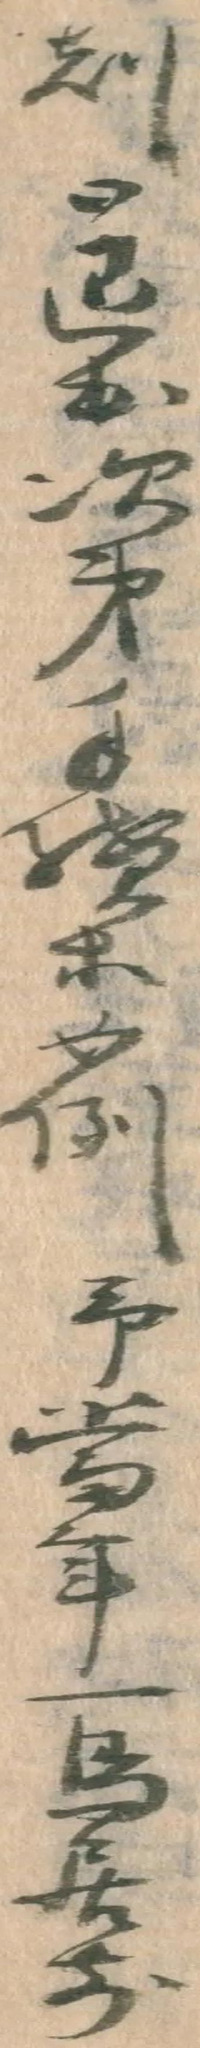刻御退出、次第手続等如例、予當年一鳥居前
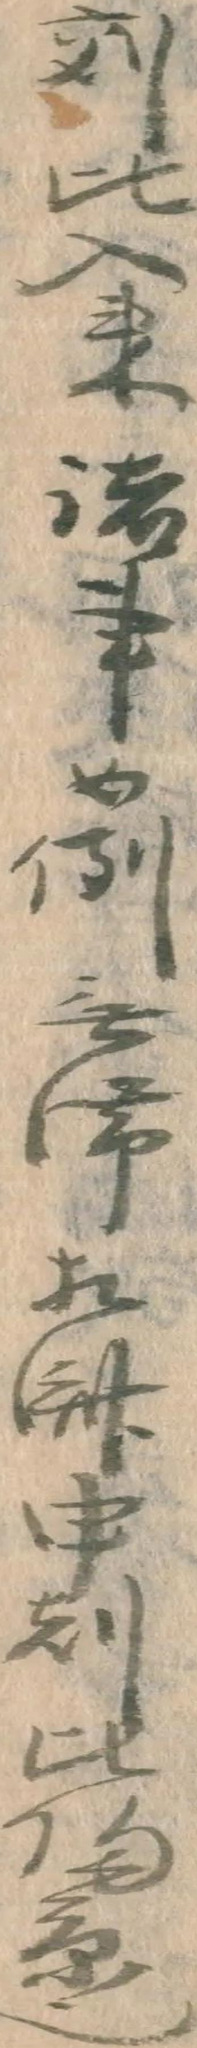刻比入来、諸事如例無滞相済、申刻比帰京也、
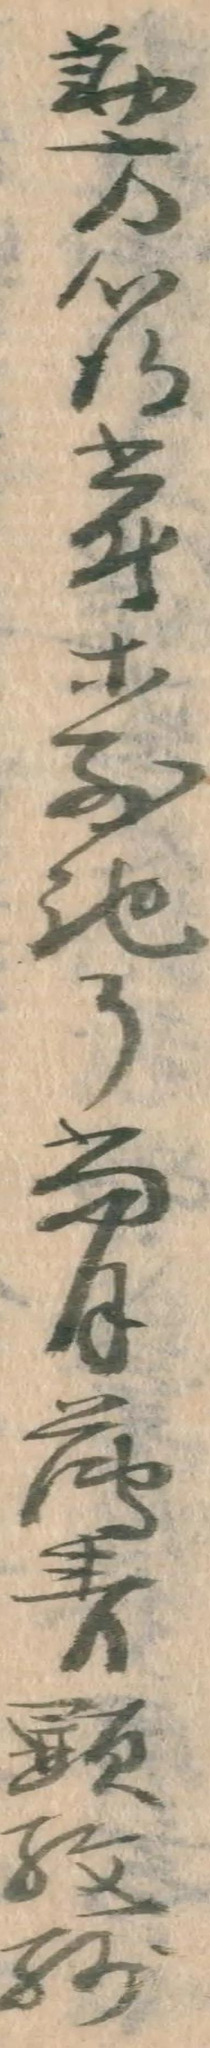勤方心得書付等別記了、當月薄青顕紋紗
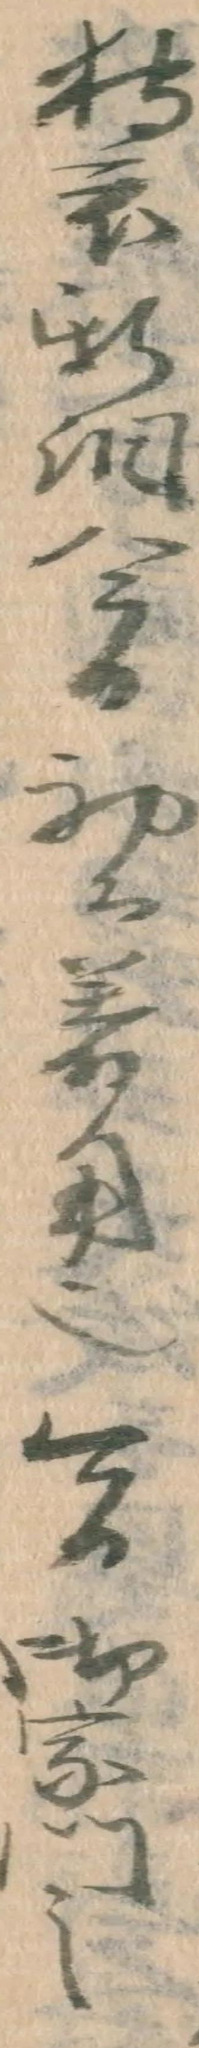狩衣新調、今日初而着用也、今日御家門之
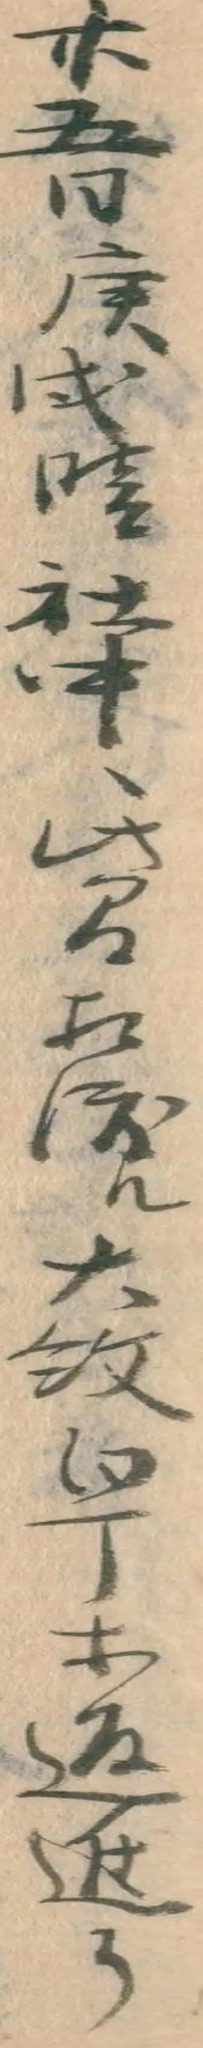廿五日庚戌晴、社中へ此間相渡ル大紋・白丁等返進了、
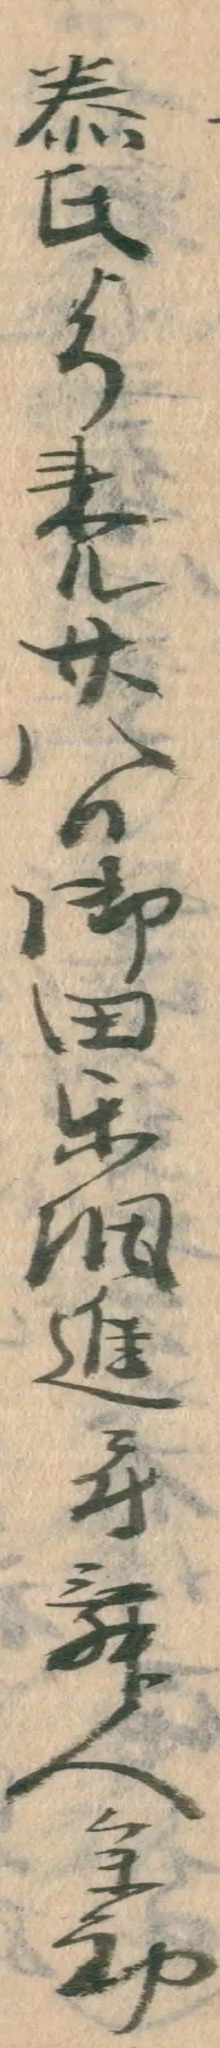泰氏より、来ル廿八日御田楽調進ニ付、舞人参勤
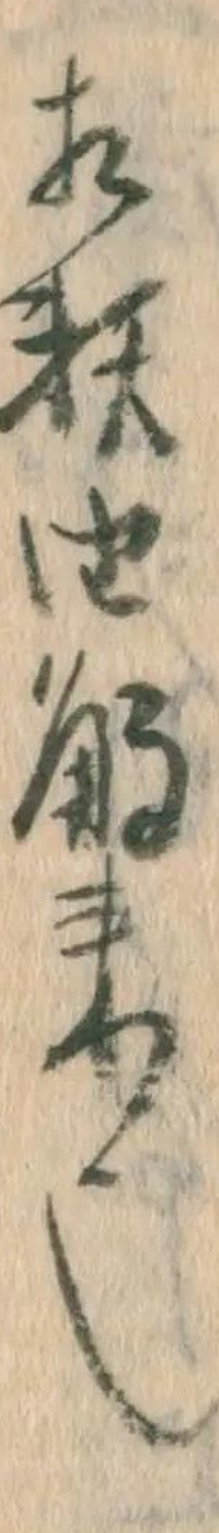相頼由触書也、
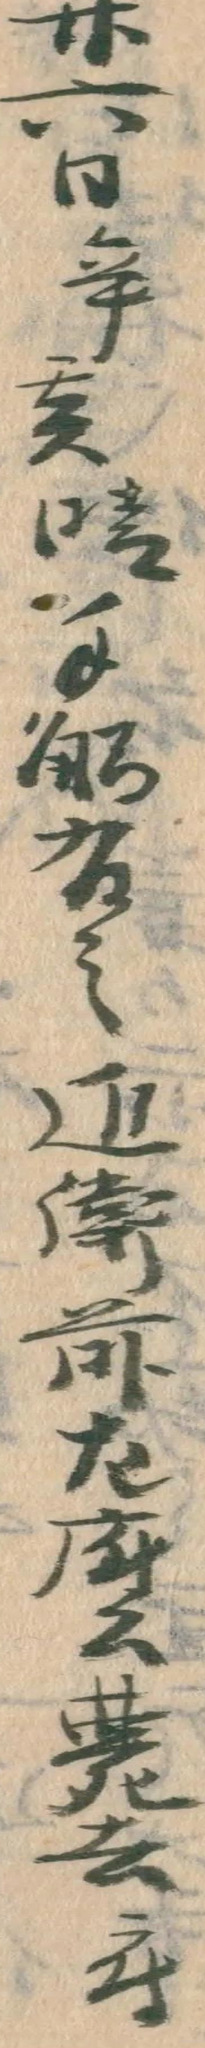廿六日辛亥晴、手触有之、近衛前左府公薨去ニ付、
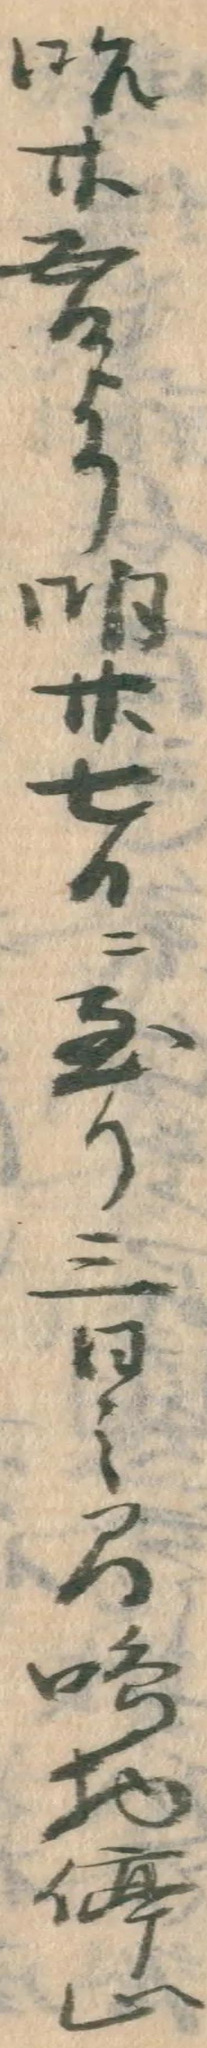昨廿五日より明廿七日ニ至り、三日之間鳴物停止
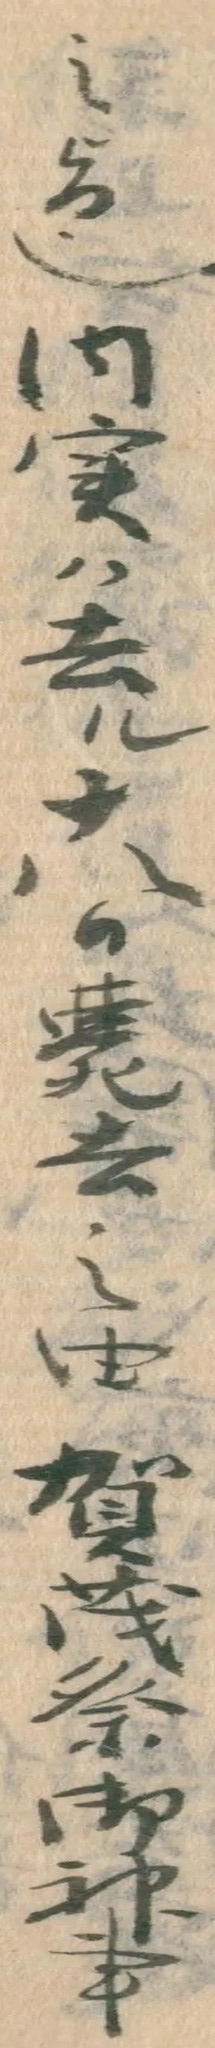之旨也、内実ハ去ル十八日薨去之由、賀茂祭御神事
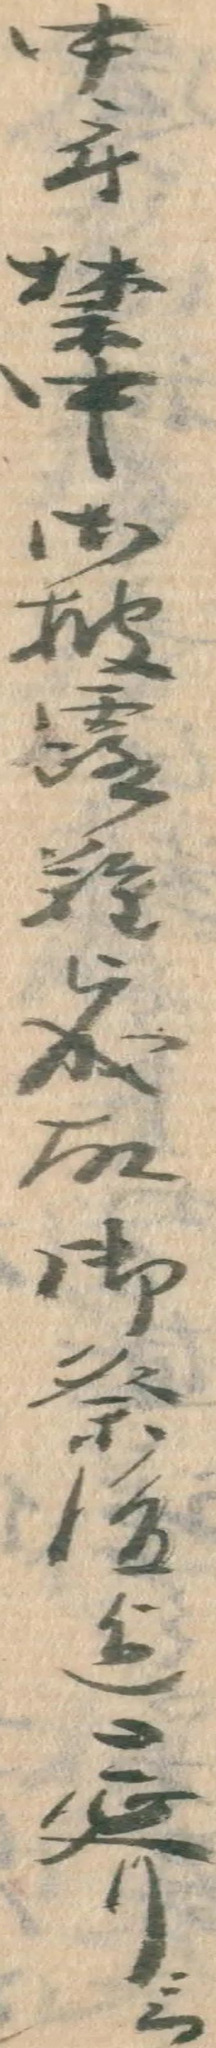中ニ付、禁中御披露難被成故、御祭後迄御延引ニ而、
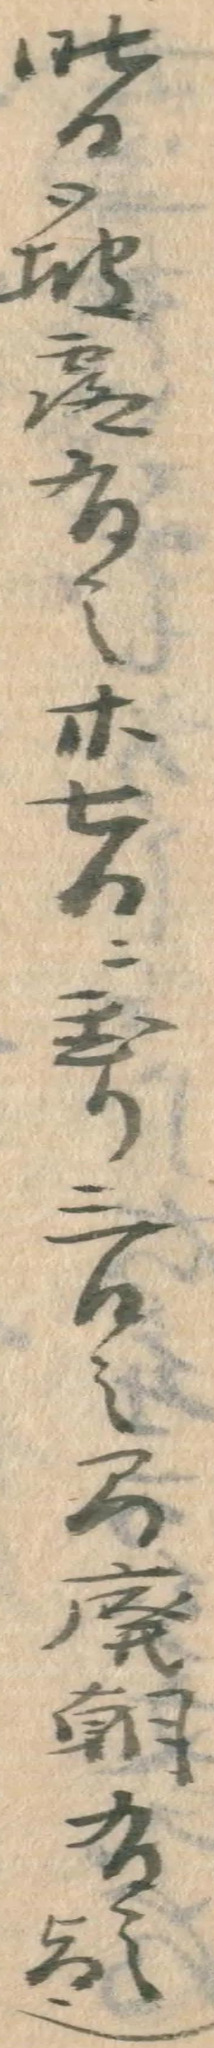昨日御披露有之、廿七日二至り三日之間廃朝有之旨也、
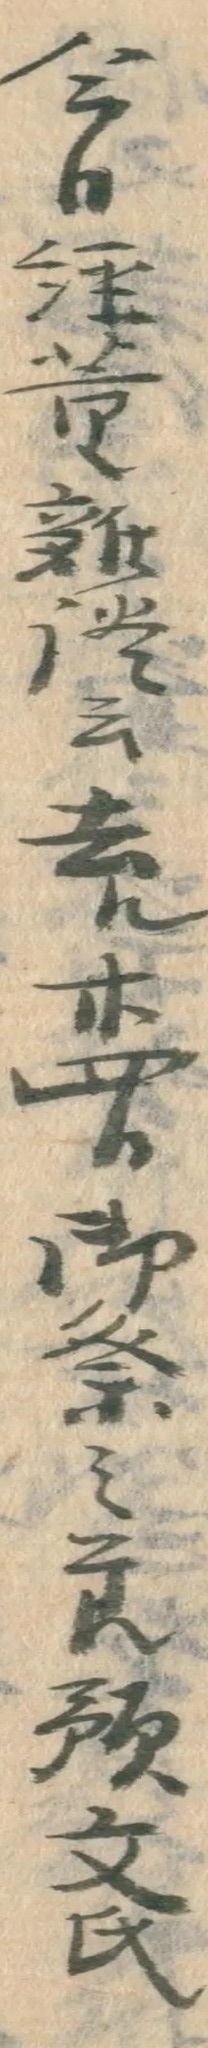今日経董雑談云、去ル廿四日御祭之節、預文氏
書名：賀茂社記録. 第63冊
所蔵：国立国会図書館 National Diet Library, JAPAN
